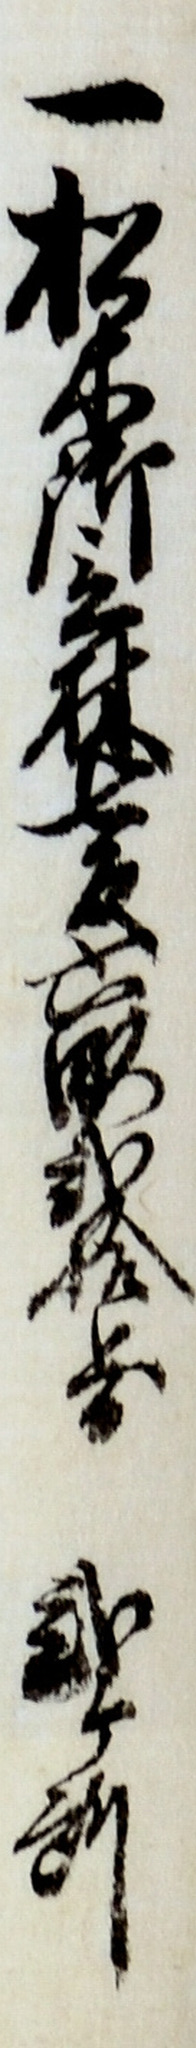一松木御立林七反六畝弐拾歩弐ヶ所
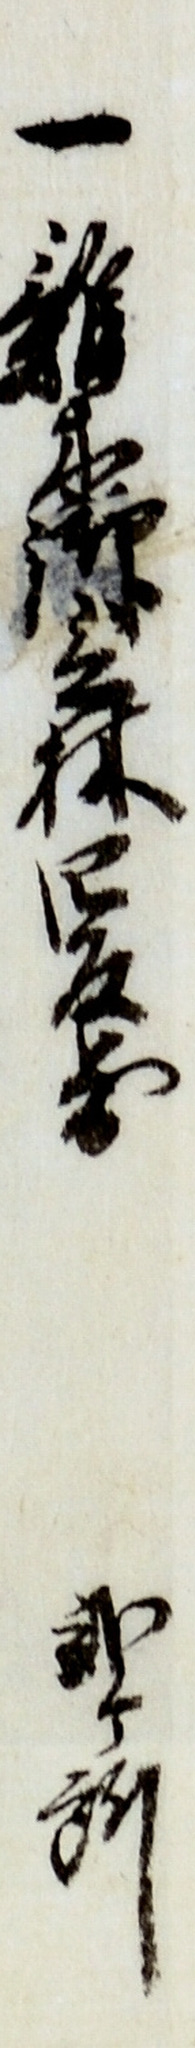一雑木御立林四反歩弐ヶ所
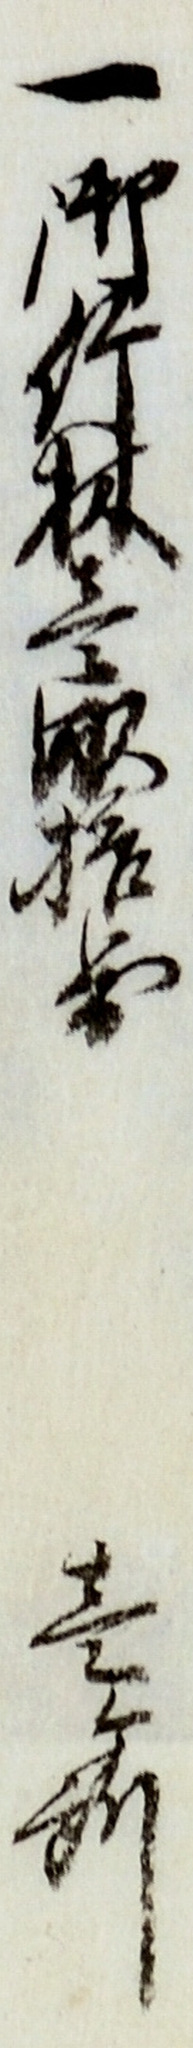一御竹林壱畝拾歩壱ヶ所
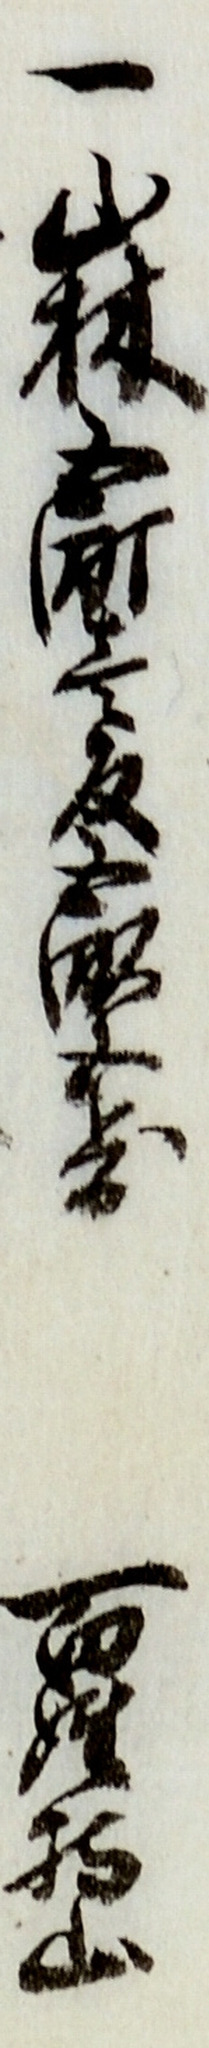一山林五町壱反五畝五歩百姓持山
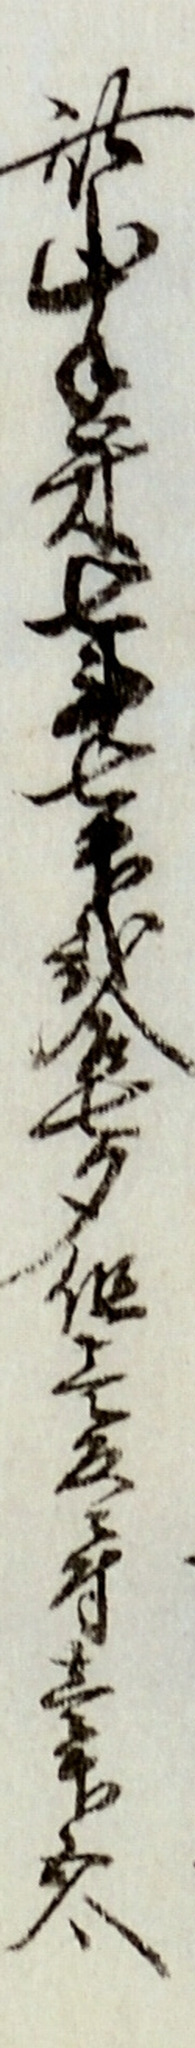此山手米七斗七升弐合七勺但壱反ニ付壱升五合

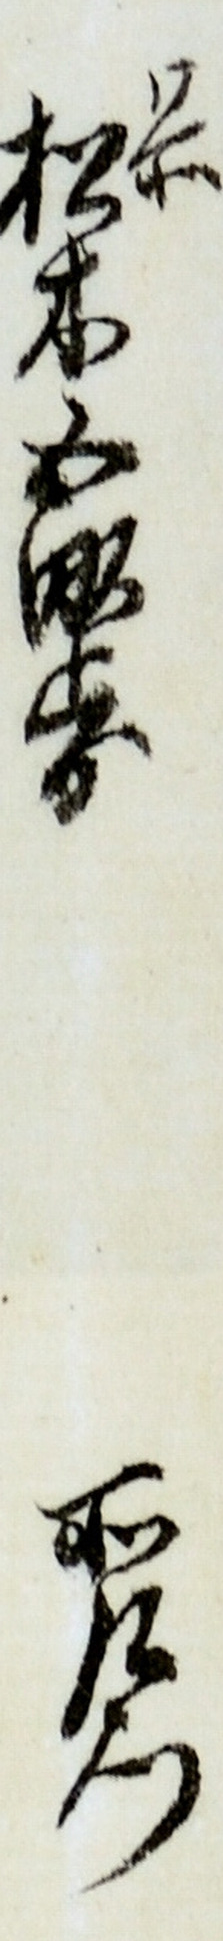松木五畝歩所左衛門
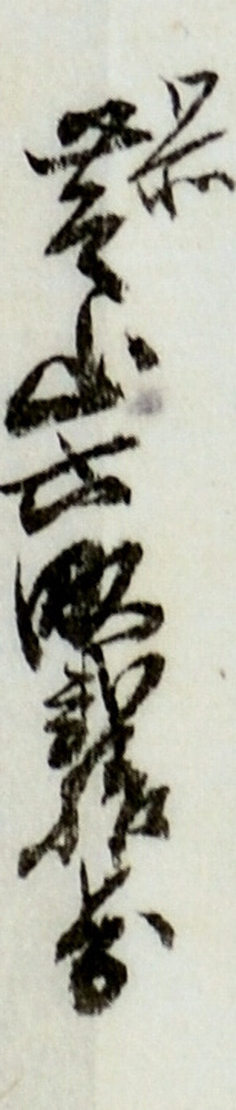芝山六畝弐拾歩利助

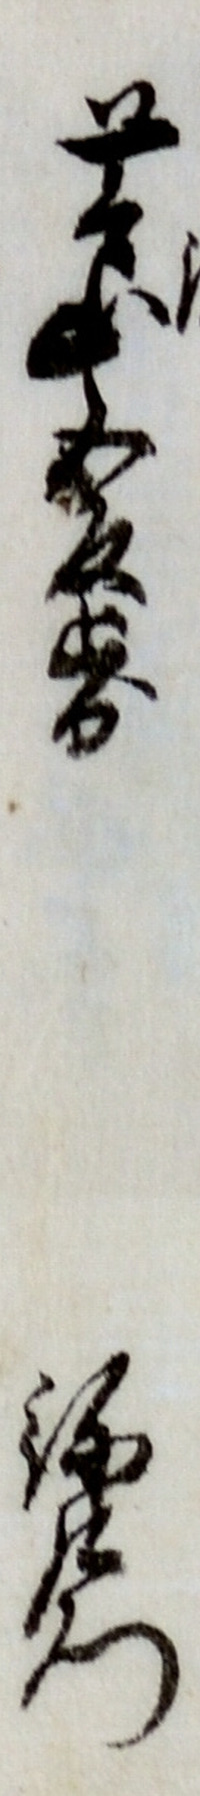芝山五反歩弥左衛門
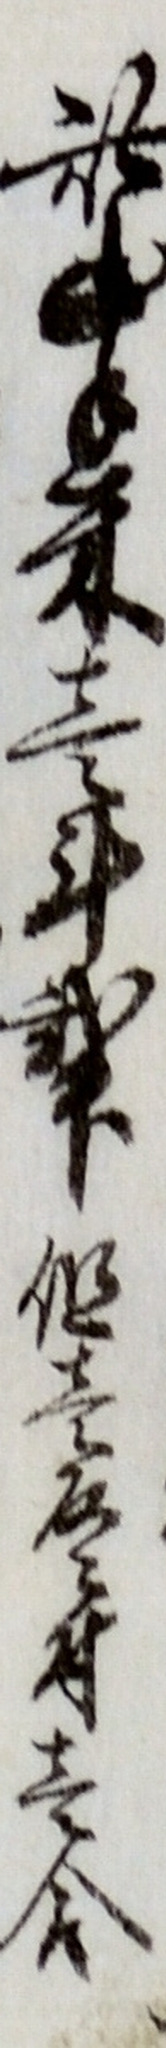此山手米壱斗弐升但壱反ニ付壱合
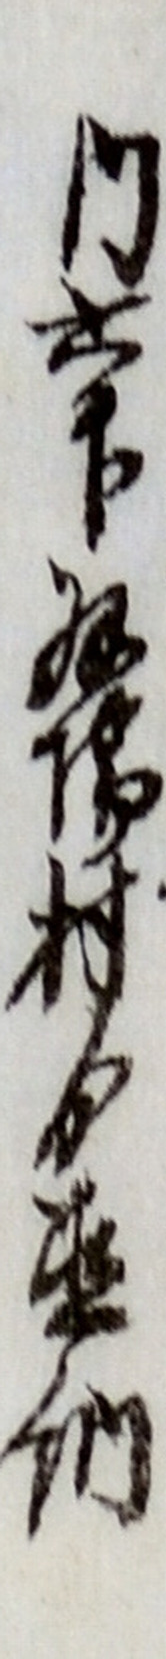内六升羽場村より直納
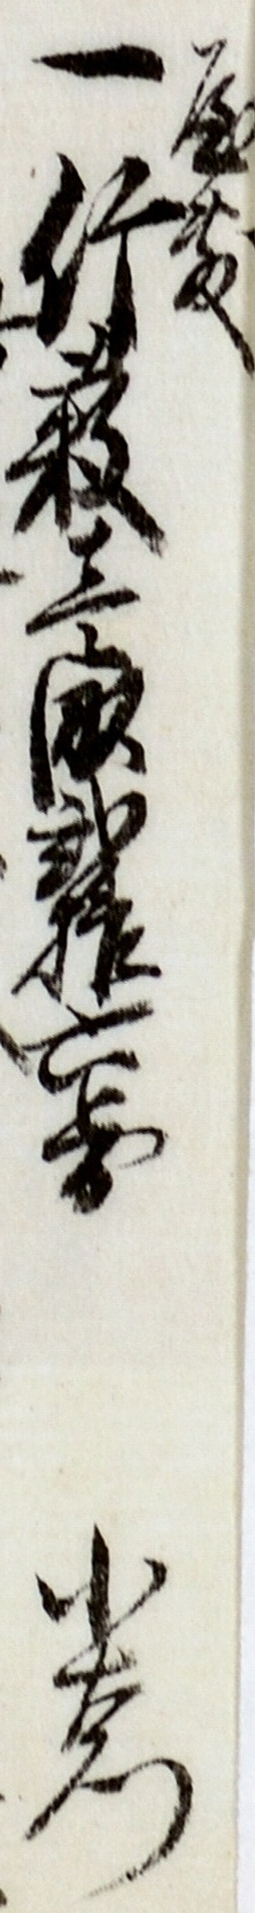一竹藪壱畝弐拾六歩小右衛門
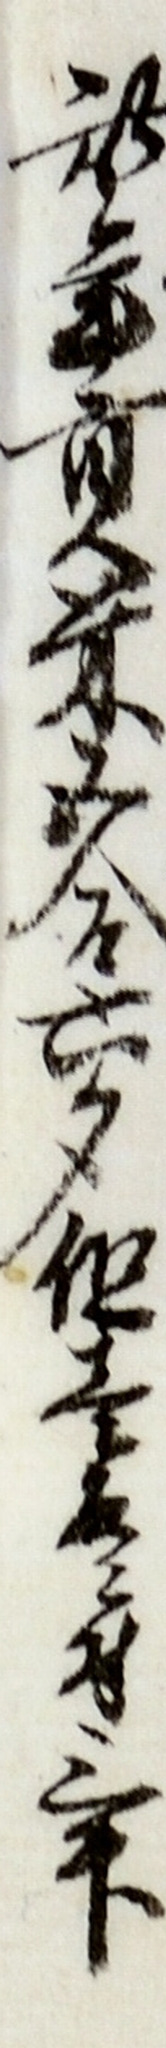此年貢米五合六勺但壱反ニ付三升
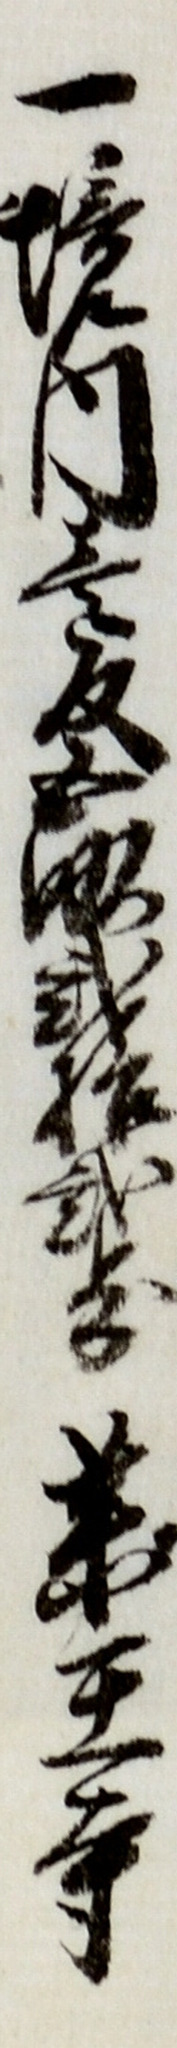一境内壱反五畝弐拾弐歩薬王寺
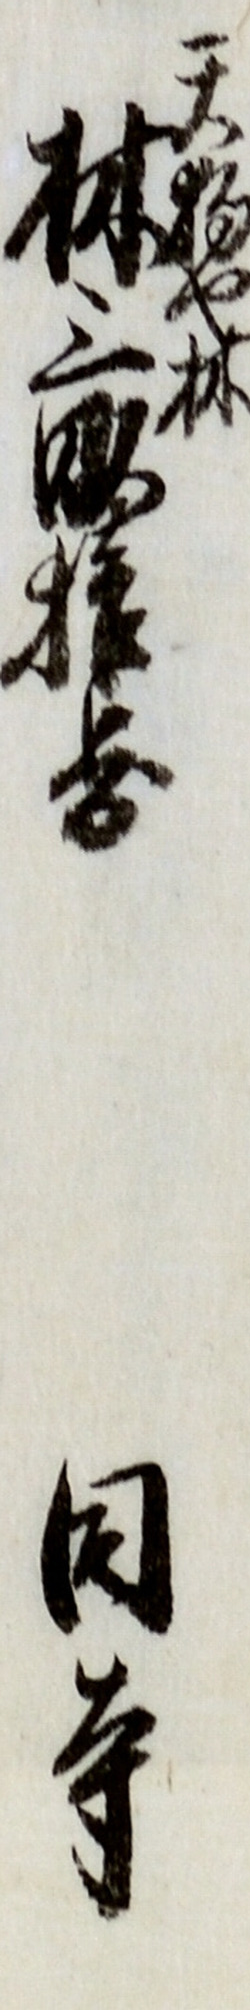林三畝拾歩同寺
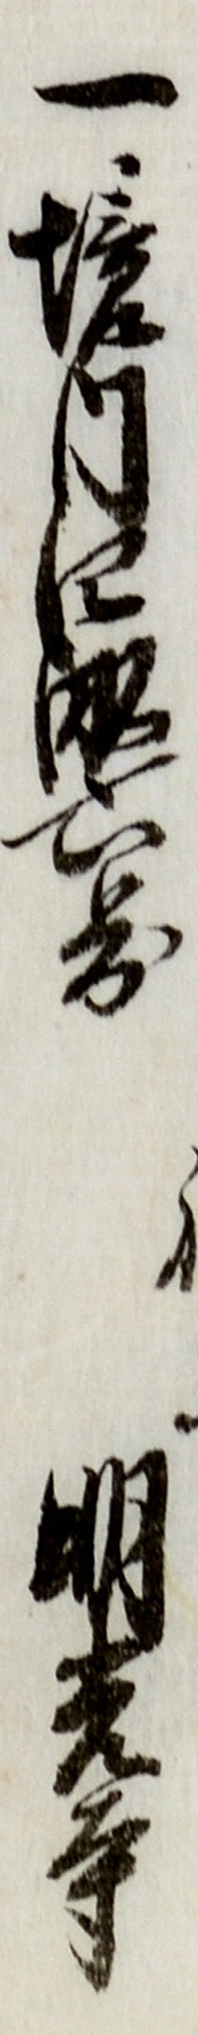一境内四畝六歩明光寺
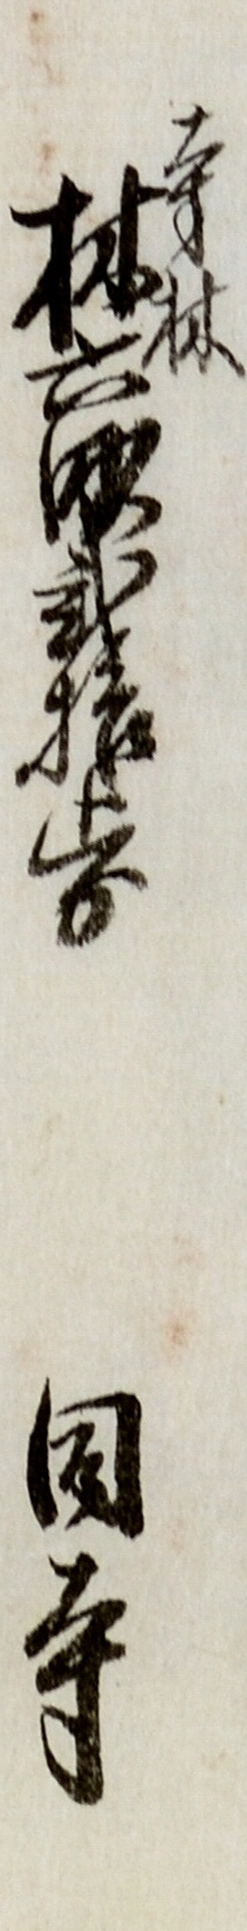林六畝弐拾歩同寺
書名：御領分中山林社地手控
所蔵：伊那市立高遠町図書館・合同会社AMANE
